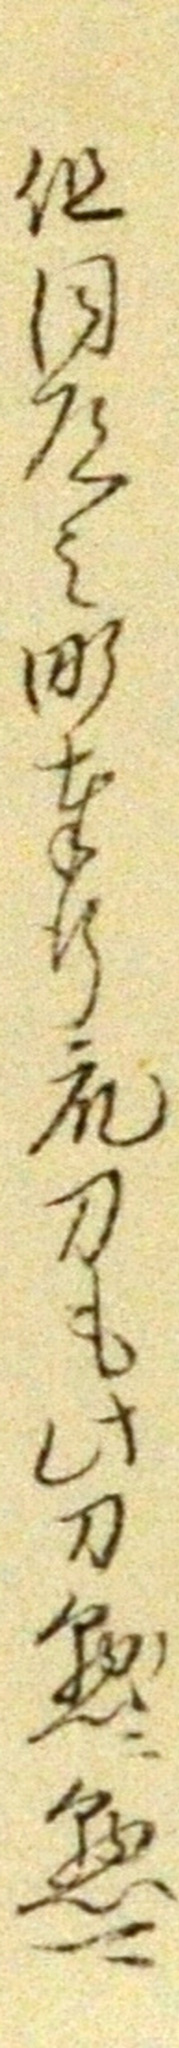但同道之町奉行衆刀も此刀懸ニ懸可
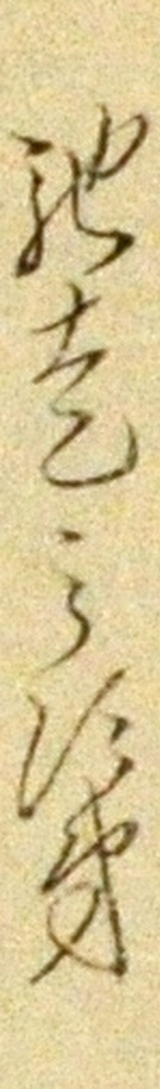馳走之次第
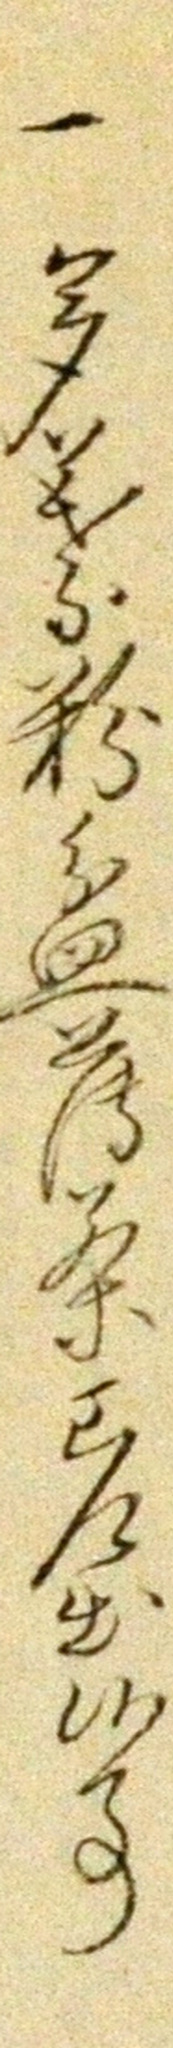一多葉粉盆薄茶差出候事
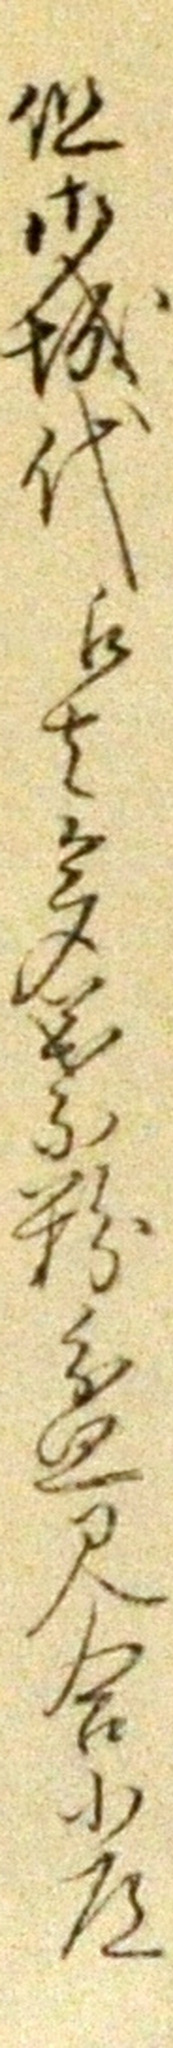但御城代江者多葉粉盆見合小道
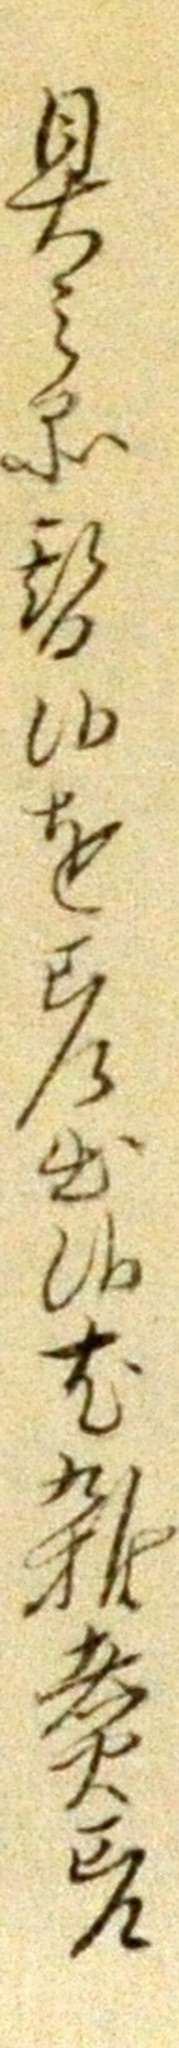具之品替候を差出候尤雑煮差
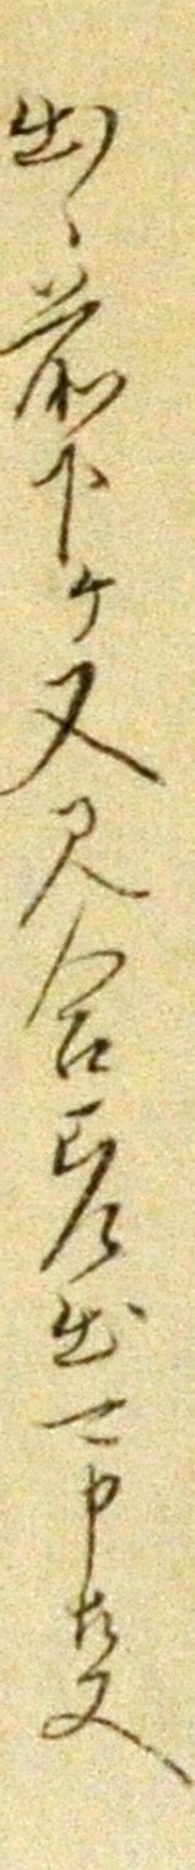出候前下ヶ又見合差出可申事
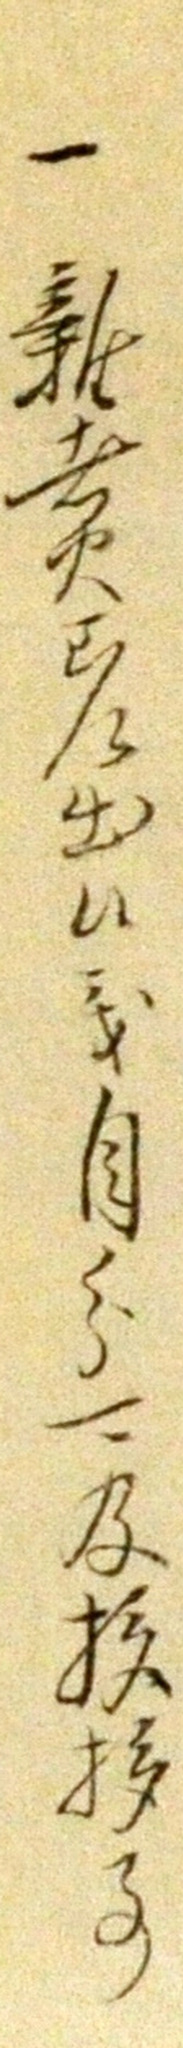一雑煮差出候儀自分可及挨拶事
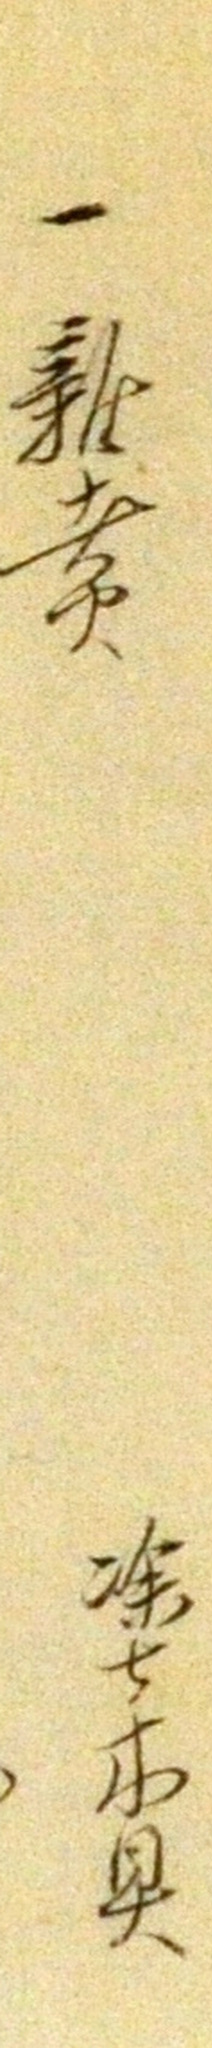一雑煮塗木具
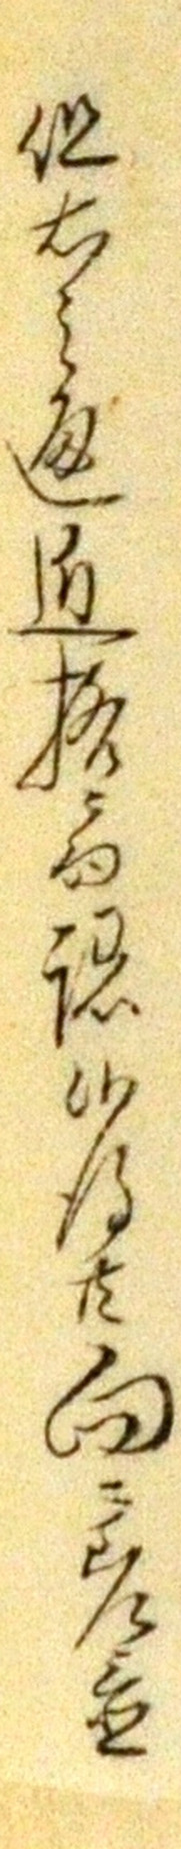但右之通近格ニ而認候得共向ニ差置
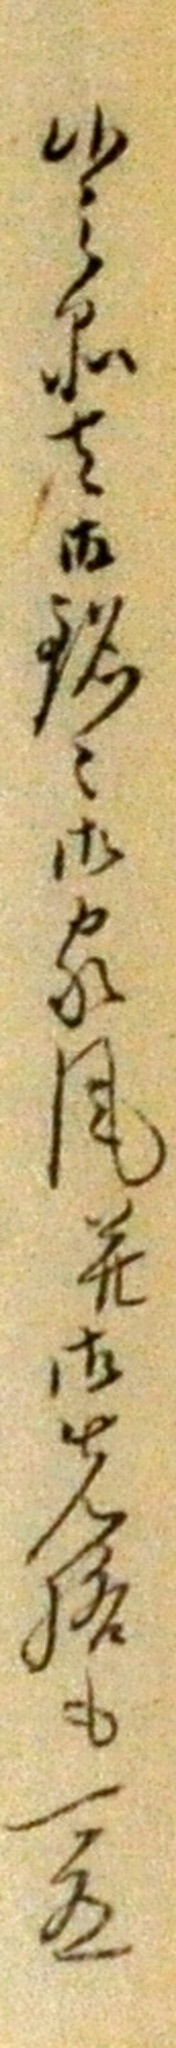候之品者御銘々御家風并御先格も可有
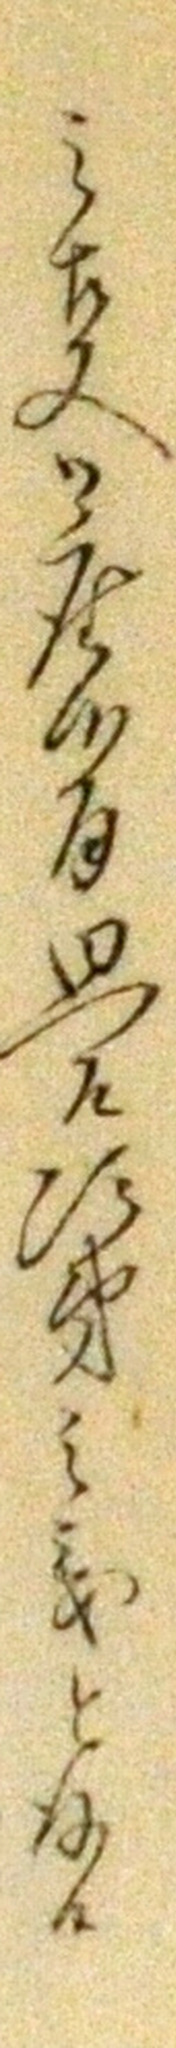之事御座候間思召次第之義と存候
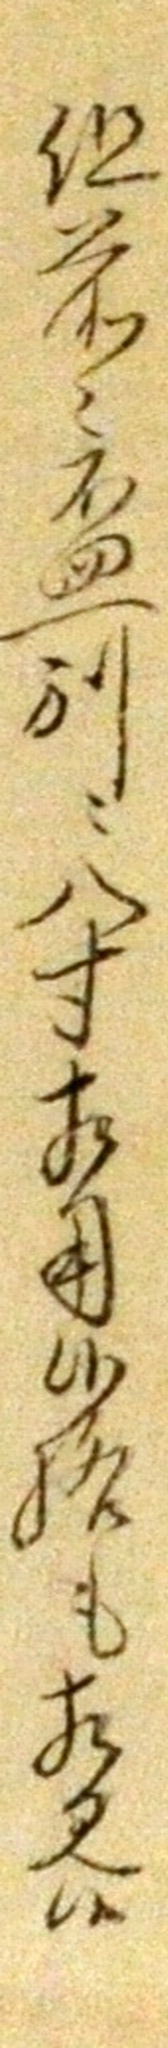但前々盃別八寸相用候格も相見候
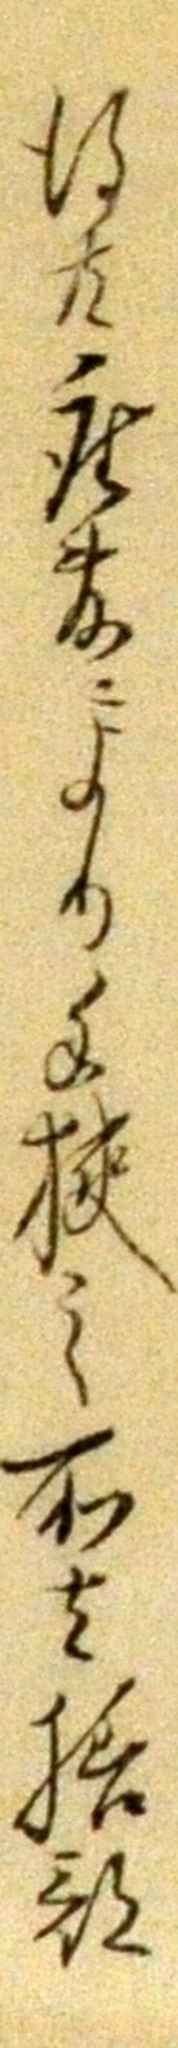得共座敷ニより手狭之所者膳部
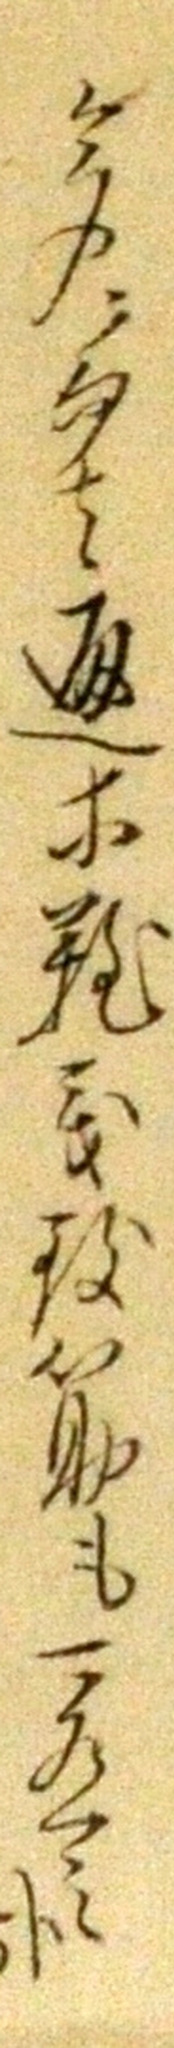多二而者通等難義致筋も可有之哉
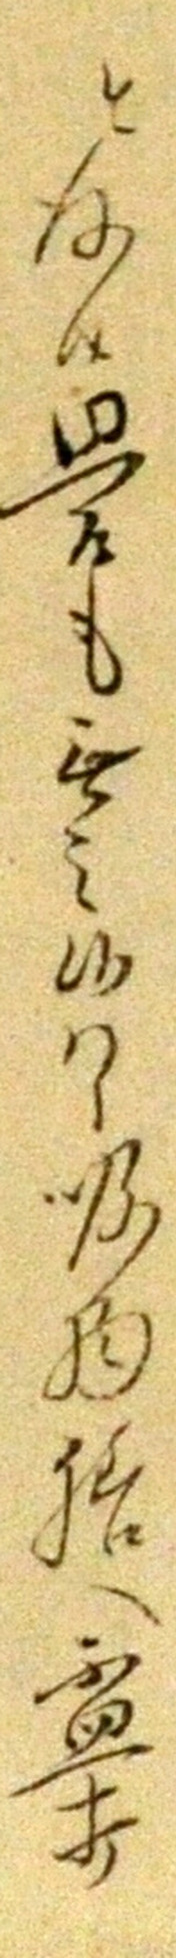と存候思召も無之候ハヽ吸物膳へ盃打
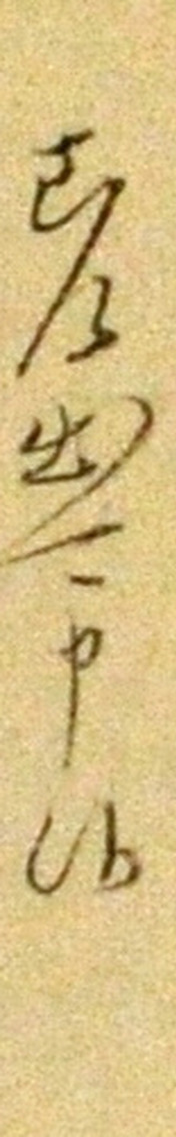差出可申候
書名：大阪加番関係諸書留〔一括〕
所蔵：伊那市立高遠町図書館・合同会社AMANE
